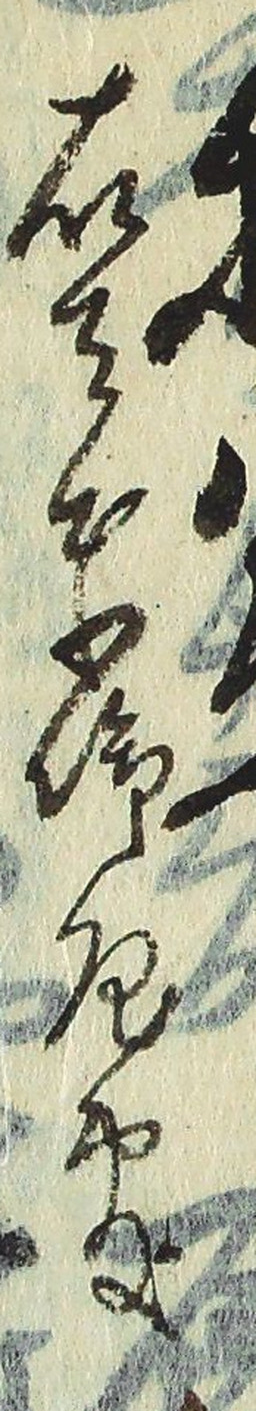右は東御屋敷
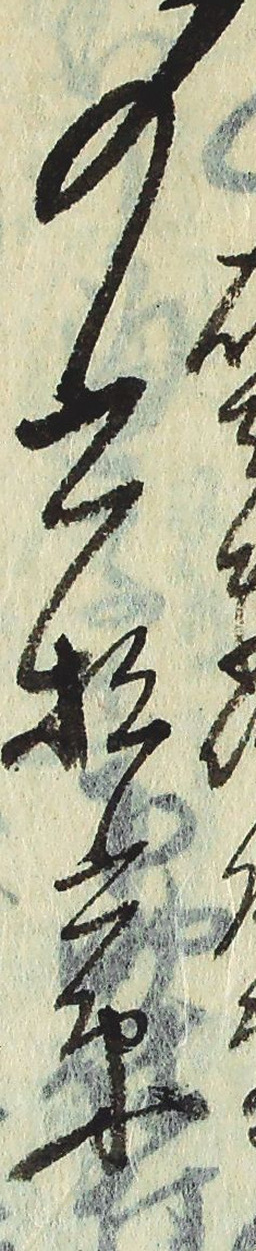〆六拾六束

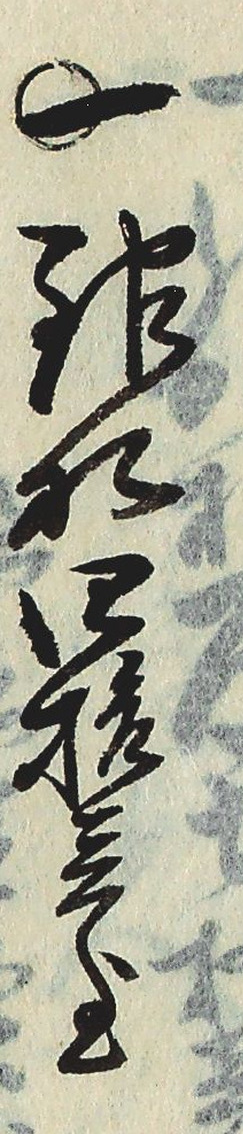一銀札四拾壱匁
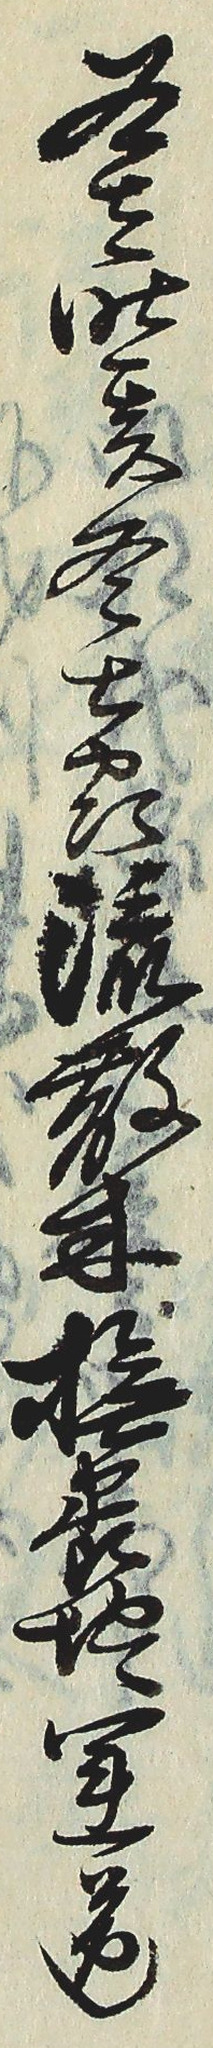右は昨亥冬土州流散木撫養地へ運送
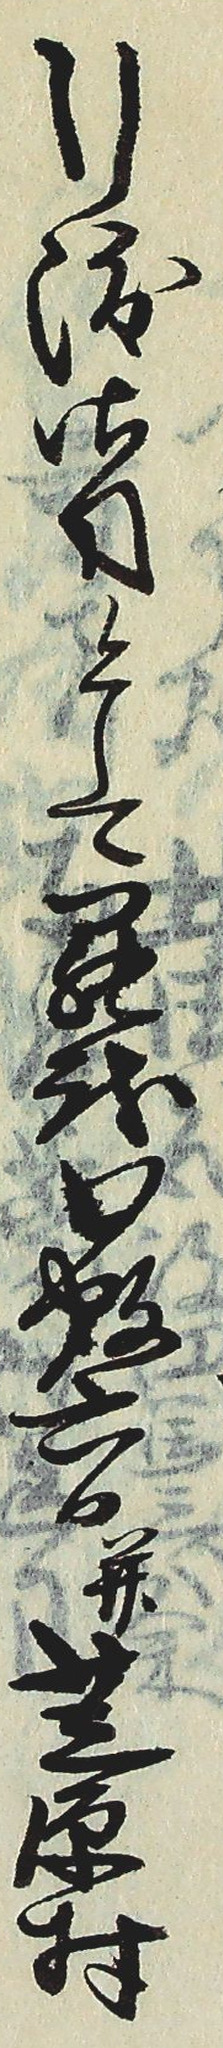引渡御用として罷越日数六日并芝原村
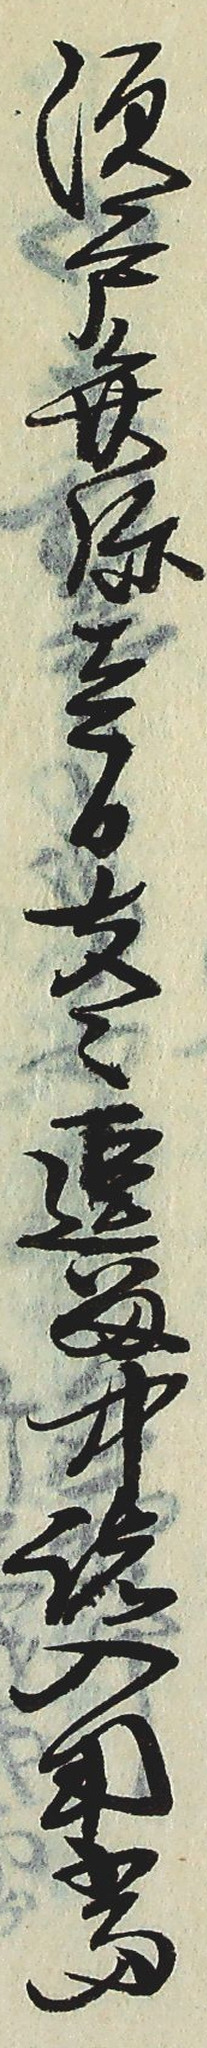須戸弁弥壱日夫々逗留中諸入用当
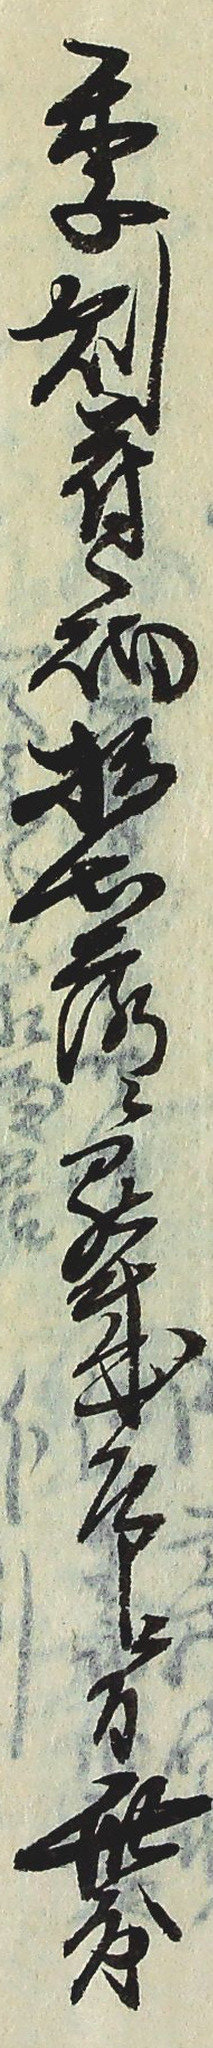季割苻之砌指出落に罷成居申に付此度
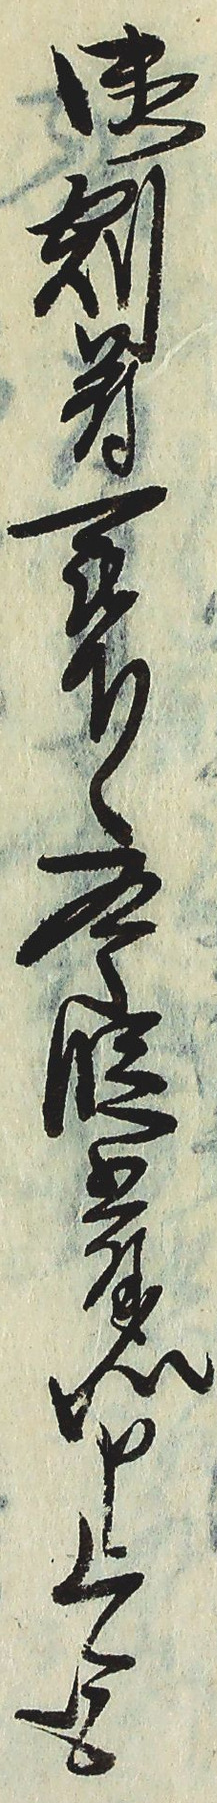御割苻可被下候右之段書付を以申上候以上
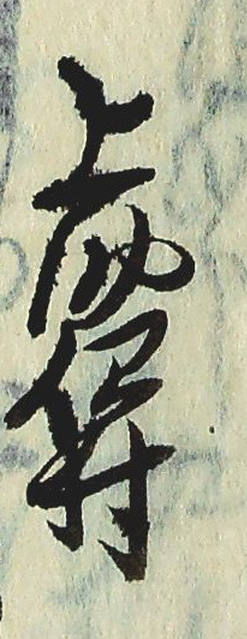上助任村
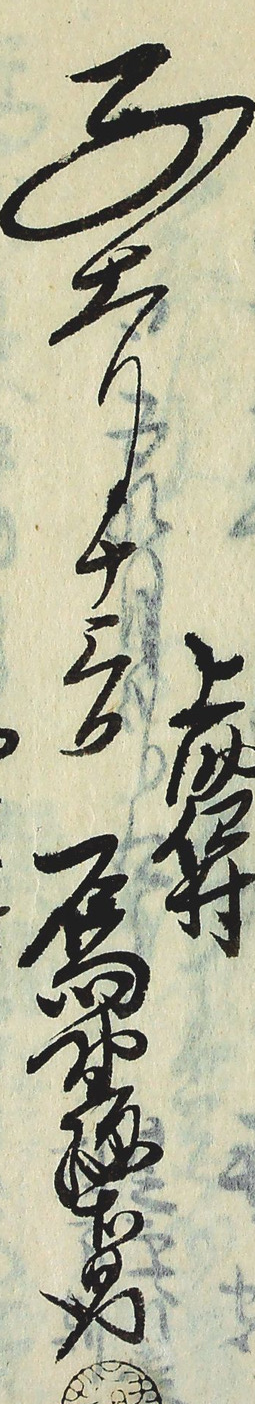子十一月十三日鷹野孫右衛門印
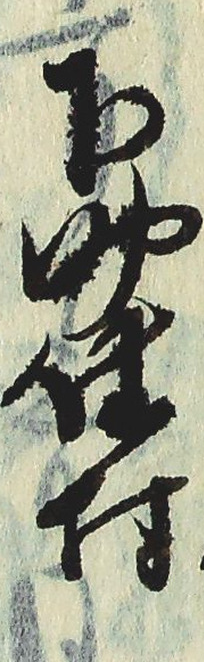下助任村
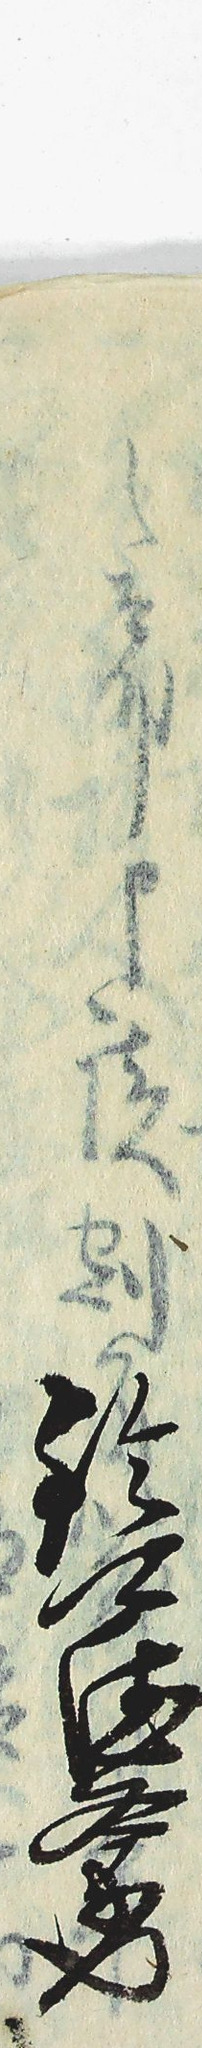鈴江徳右衛門
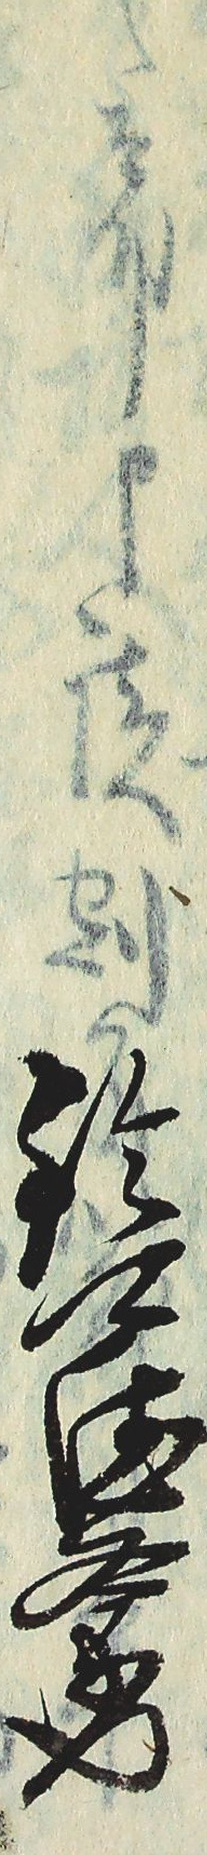鈴江徳右衛門
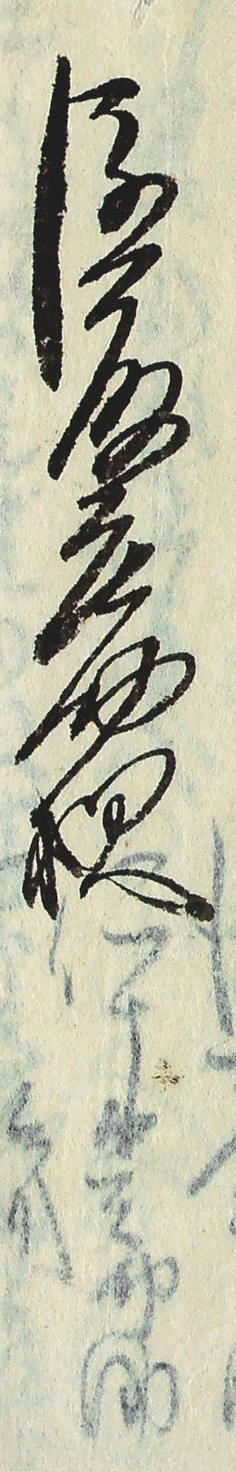後藤庄助様
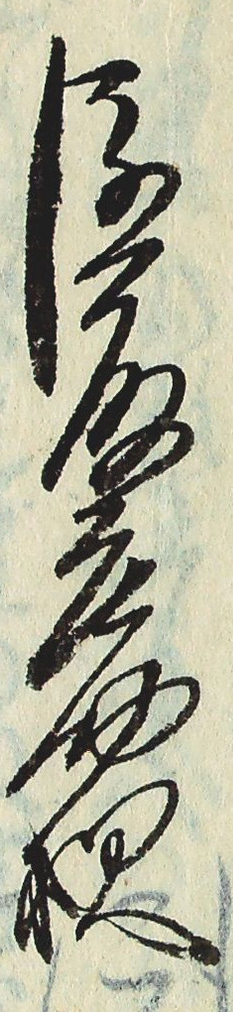後藤庄助様

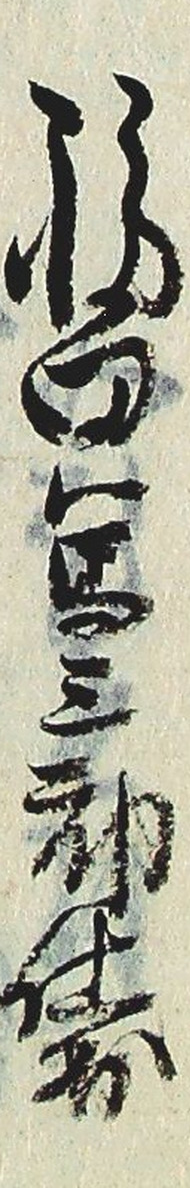覚福田篤三郎仕出
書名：名東郡中諸割賦元帳
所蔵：鳴門教育大学 Naruto University of Education
